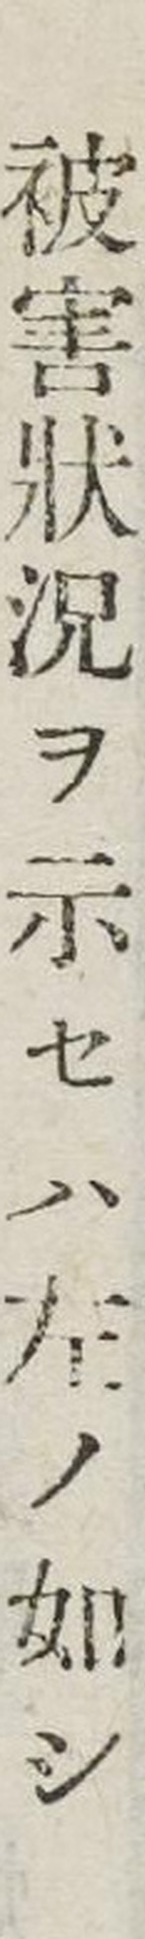被害状況ヲ示セハ左ノ如シ
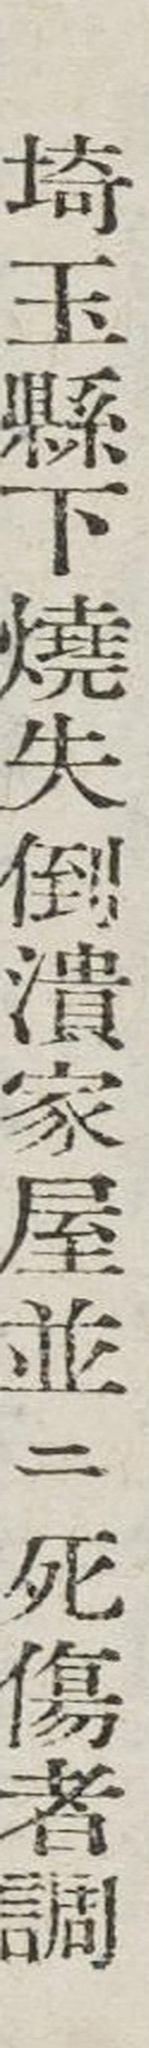埼玉県下焼失倒潰家屋並ニ死傷者調
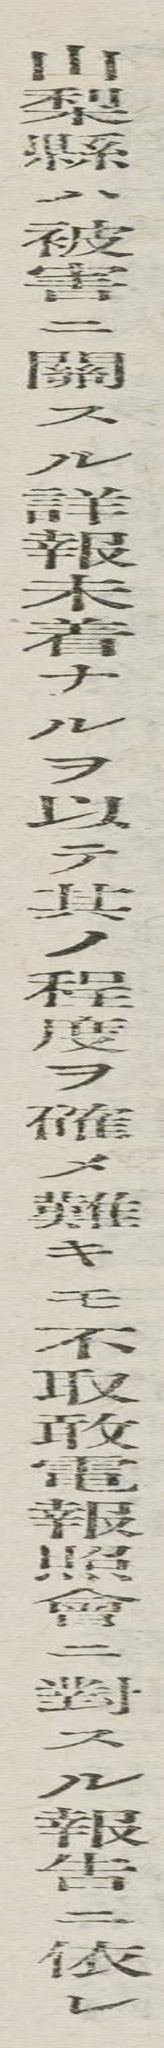山梨県ハ被害ニ関スル詳報未着ナルヲ以テ其ノ程度ヲ確メ難キモ不取敢電報照会ニ対スル報告ニ依レ
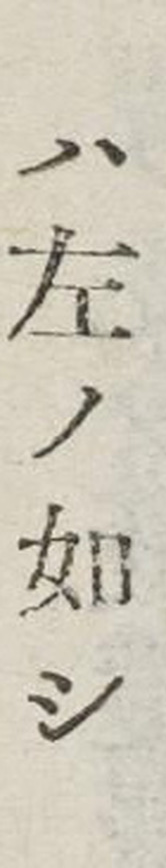ハ左ノ如シ
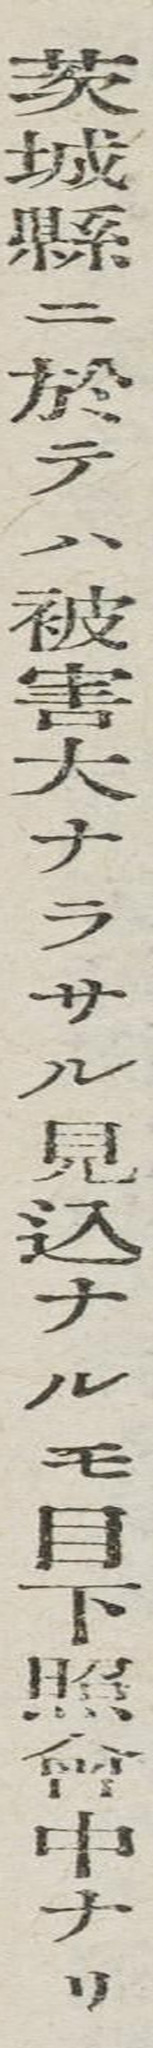茨城県ニ於テハ被害大ナラサル見込ナルモ目下照会中ナリ

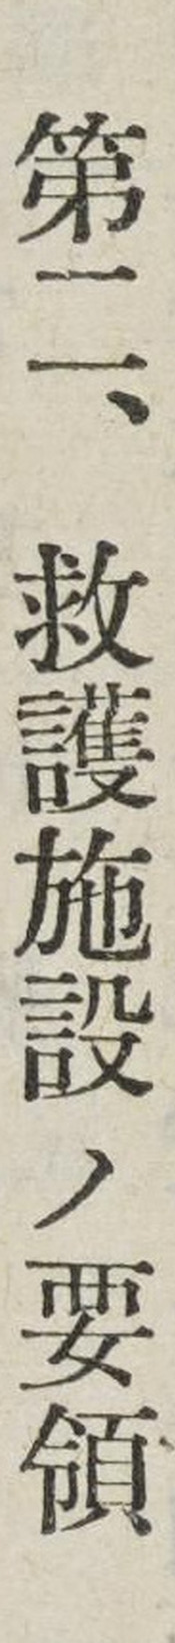第二、救護施設ノ要領
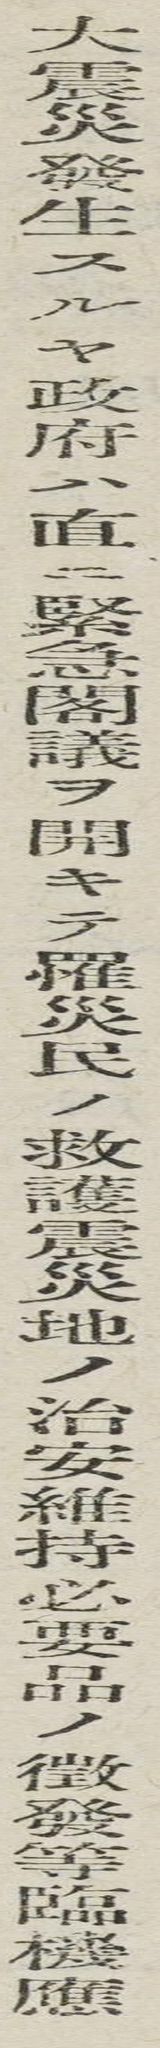大地震発生スルヤ政府ハ直ニ緊急閣議ヲ開キテ罹災民ノ救護震災地ノ治安維持必要品ノ徴発等臨機応
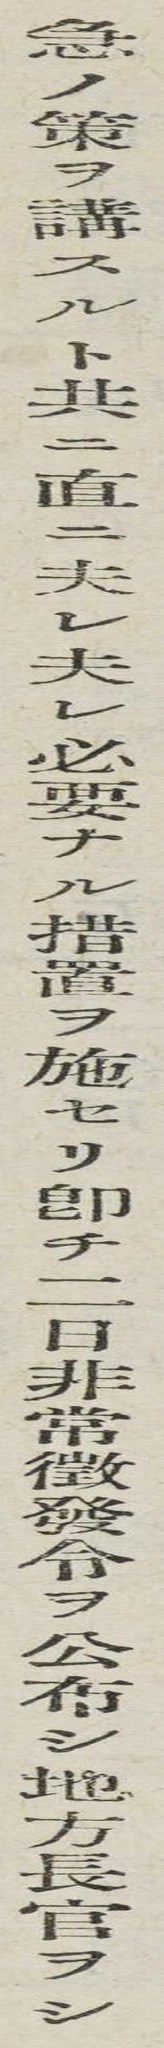急ノ策ヲ講スルト共ニ直ニ夫レ夫レ必要ナル措置ヲ施セリ即チ二日非常徴発令ヲ公布シ地方長官ヲシ
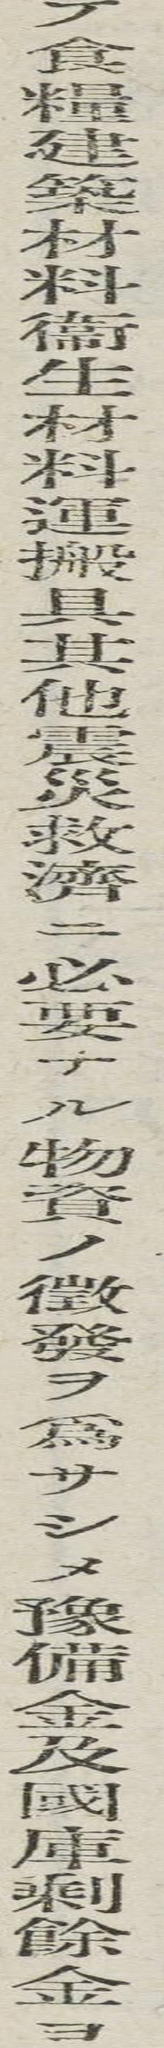テ食糧建築材料衛生材料運搬具其他震災救済ニ必要ナル物資ノ徴発ヲ為サシメ予備金及国庫余剰金ヨ
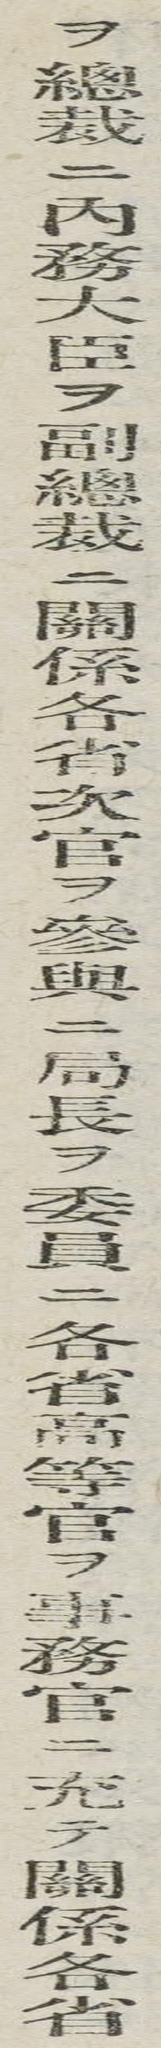ヲ総裁ニ内務大臣ヲ副総裁ニ関係各省次官ヲ参与ニ局長ヲ委員ニ各省高等官ヲ事務官ニ充テ関係各省
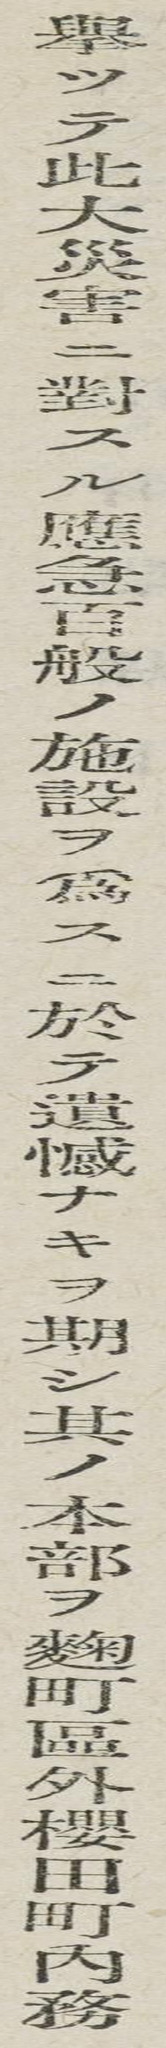挙ツテ此大災害ニ対スル応急百般ノ施設ヲ為スニ於テ遺憾ナキヲ期シ其ノ本部ヲ麹町区外桜田町内務
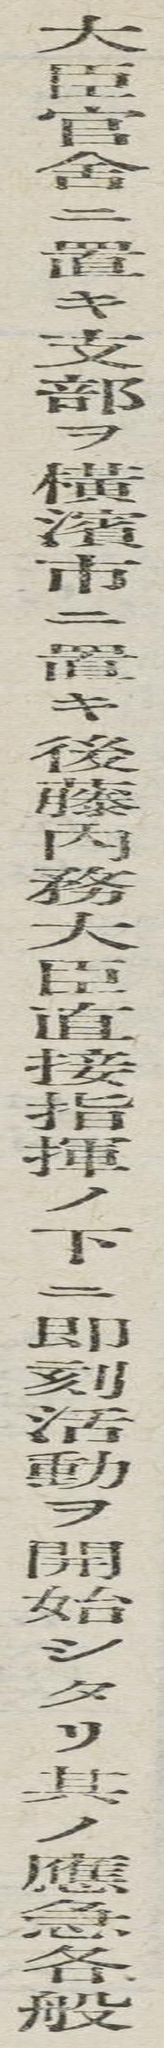大臣官舎ニ置キ支部ヲ横浜市ニ置キ後藤内務大臣直接指揮ノ下ニ即刻活動ヲ開始シタリ其ノ応急各般
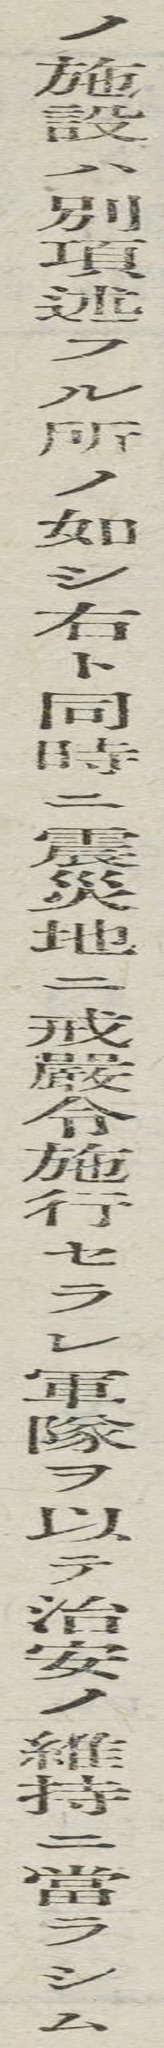ノ施設ハ別項述フル所ノ如シ右ト同時ニ震災地ニ戒厳令施行セラレ軍隊ヲ以テ治安ノ維持ニ当ラシム
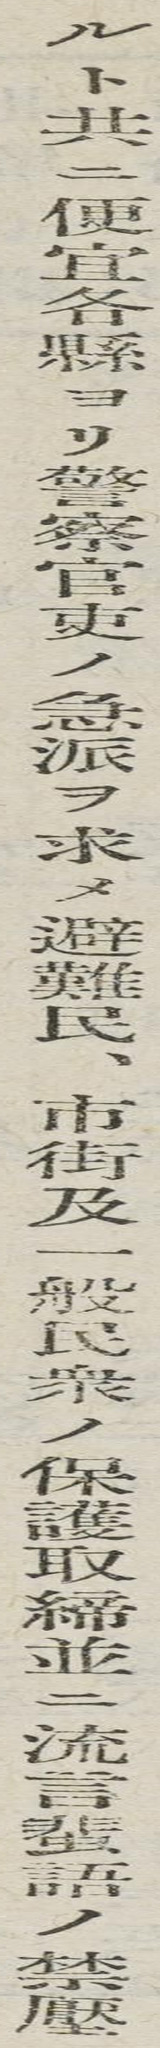ルト共ニ便宜各県ヨリ警察官吏ノ急派ヲ求メ避難民、市街及一般民衆ノ保護取締並ニ流言蜚語ノ禁圧
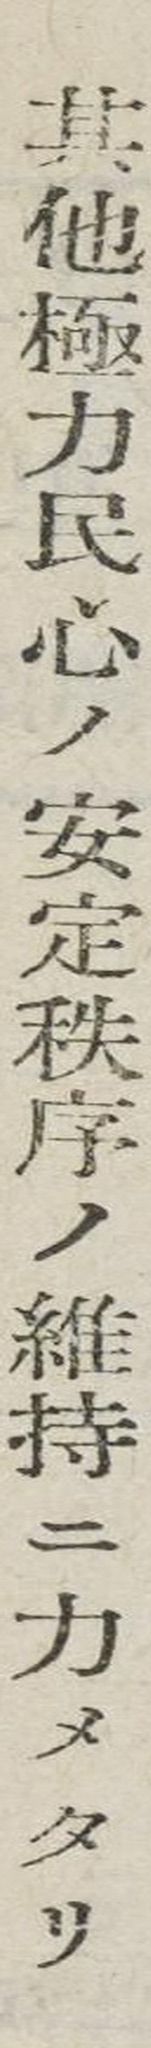其他極力民心ノ安定秩序ノ維持ニ力メタリ
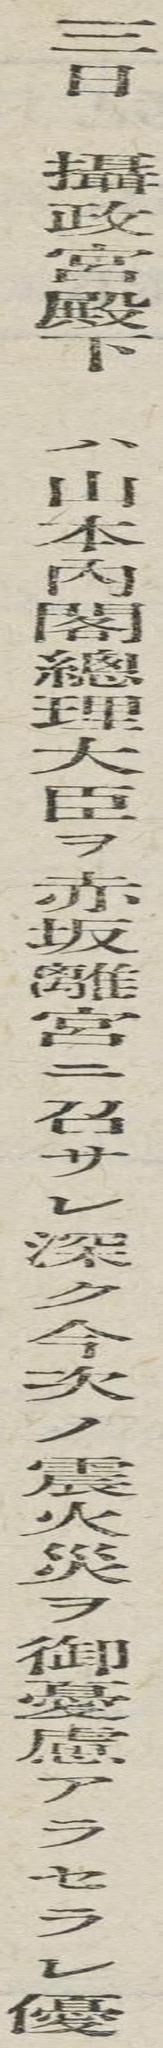三日摂政宮殿下ハ山本内閣総理大臣ヲ赤坂離宮ニ召サレ深ク今次ノ震火災ヲ御憂慮アラセラレ優
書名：震災被害状況並救護施設概要
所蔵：東京大学地震研究所図書室 Earthquake Research Institute Library, The University of Tokyo, JAPAN
